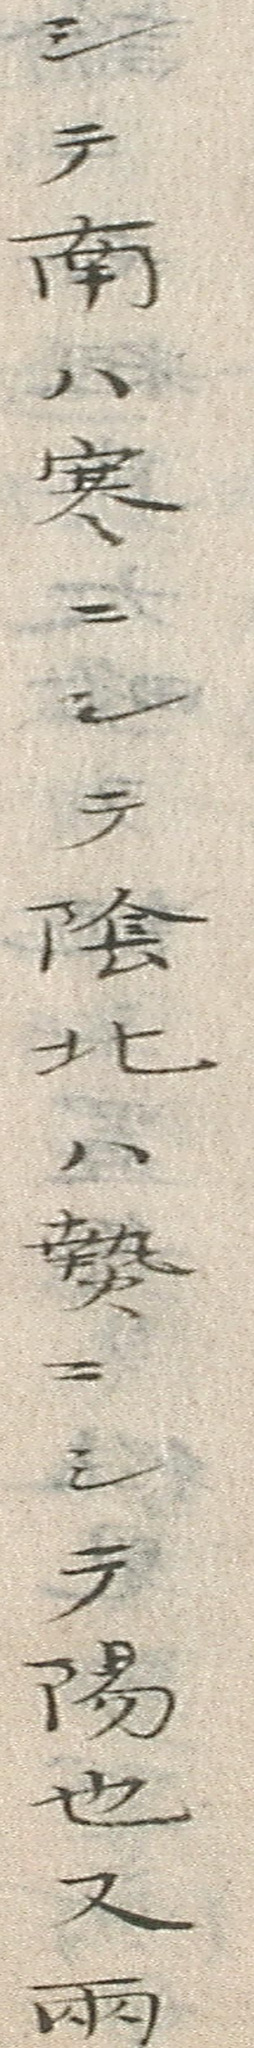シテ南ハ寒ニシテ陰北ハ熱ニシテ陽也又両
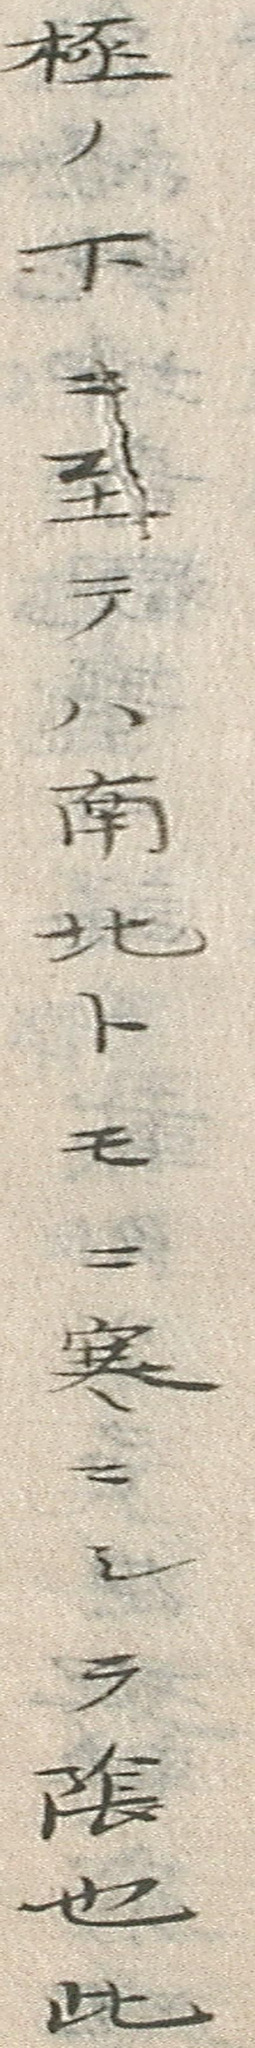極ノ下ニ至テハ南北トモニ寒ニシテ陰也此
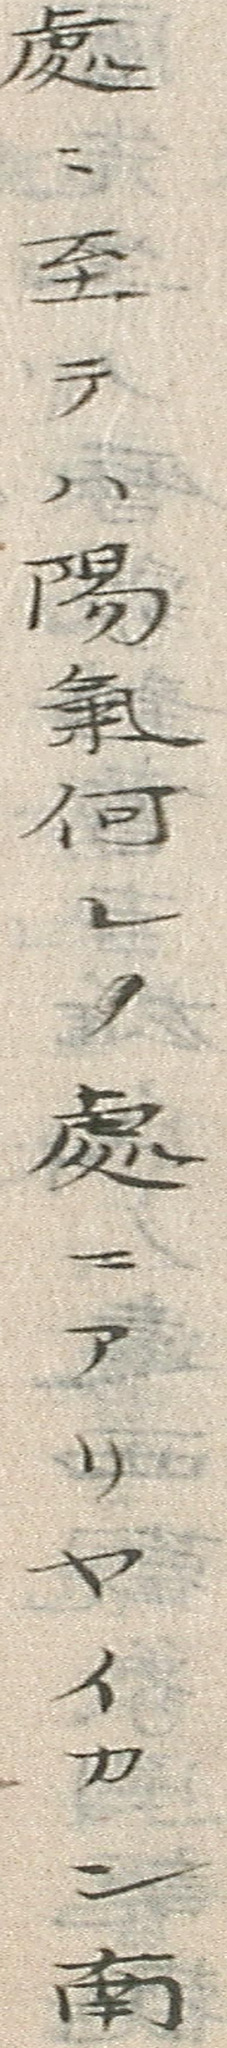処ニ至テハ陽気何レノ処ニアリヤイカン南
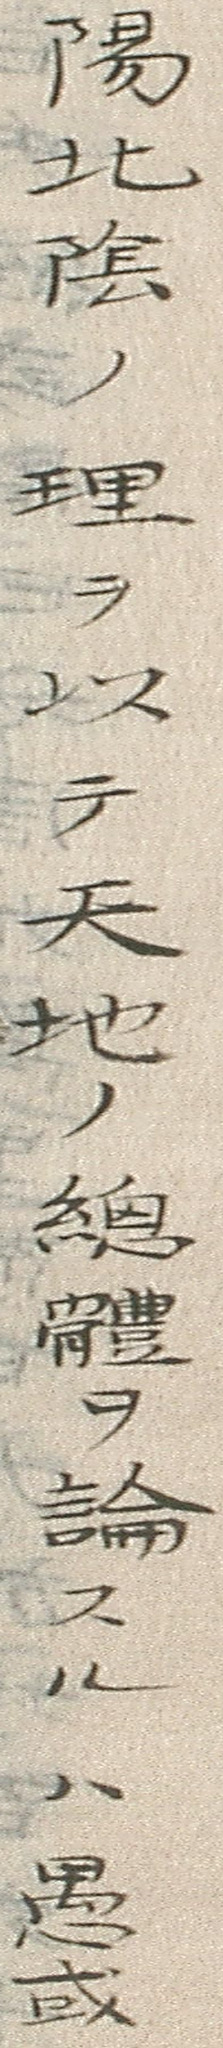陽北陰ノ理ヲ以テ天地ノ総体ヲ論スルハ愚或
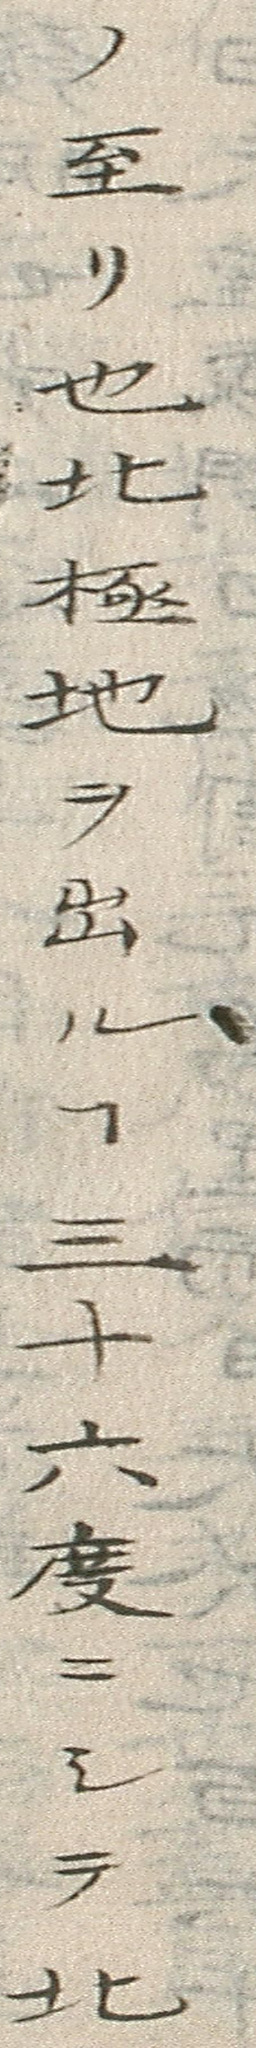ノ至リ也北極地ヲ出ルコト三十六度ニシテ北
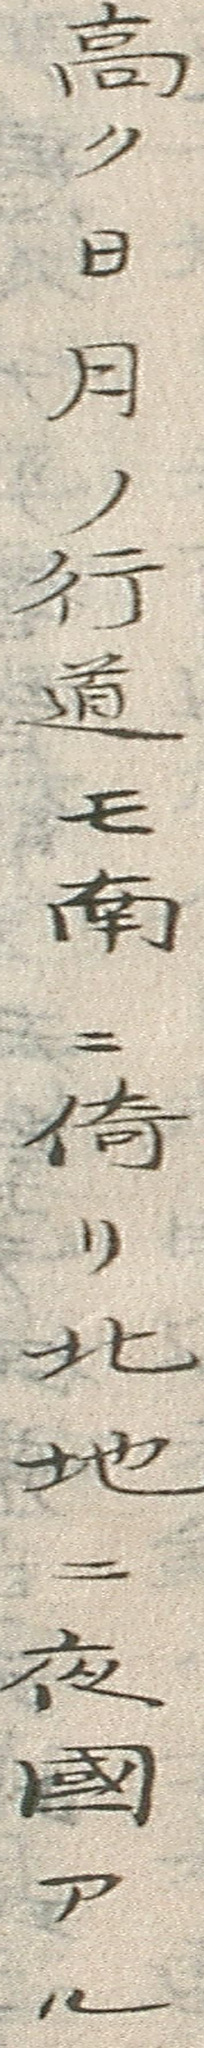高ク日月ノ行道モ南ニ倚リ北地ニ夜国アル
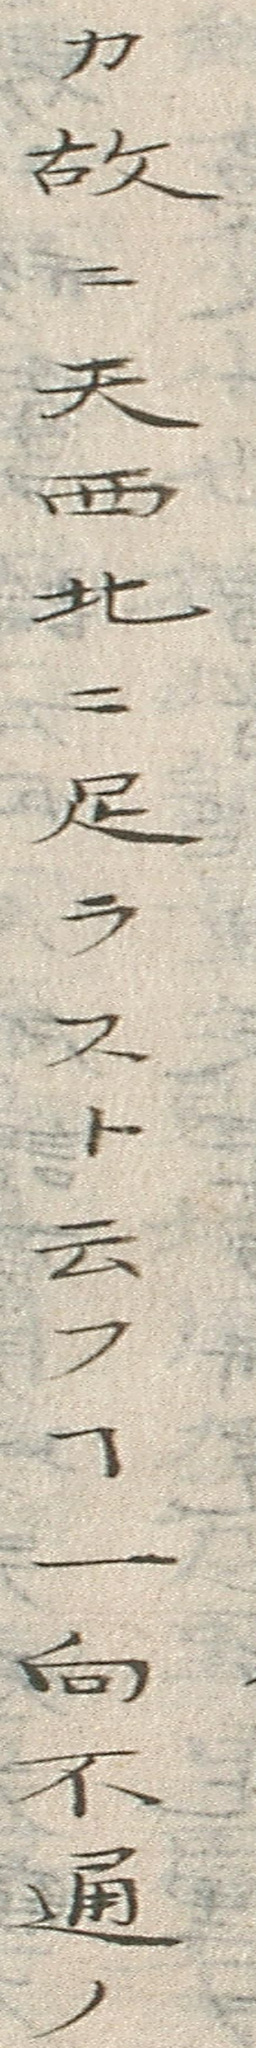カ故ニ天西北ニ足ラスト云フコト一向不通ノ
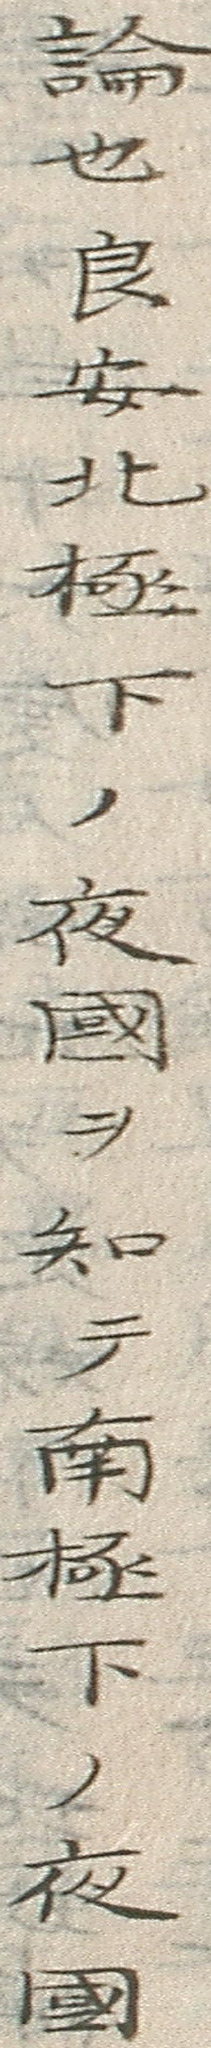論也良安北極下ノ夜国ヲ知テ南極下ノ夜国
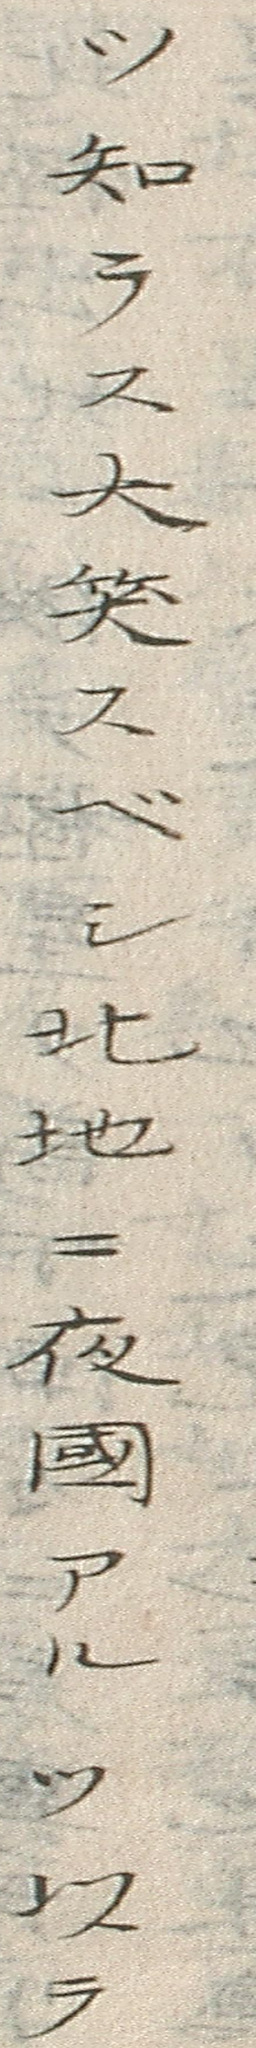ツ知ラス大笑スベシ北地ニ夜国アルツ以テ
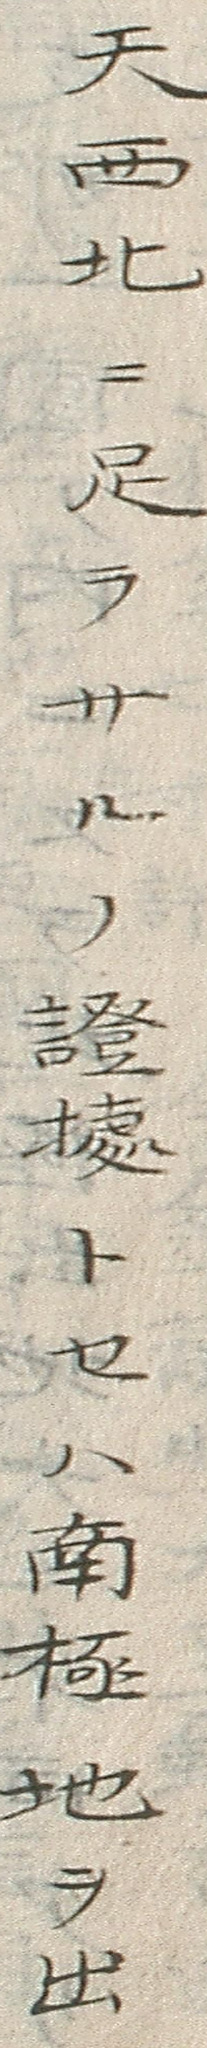天西北ニ足ラサルノ証拠トセハ南極地ヲ出
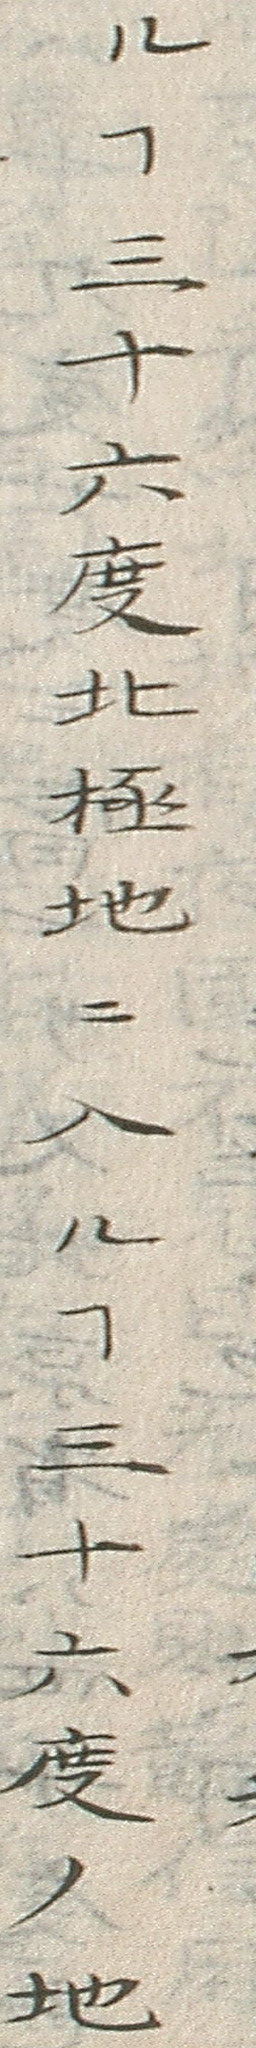ルコト三十六度北極地ニ入ルコト三十六度ノ地
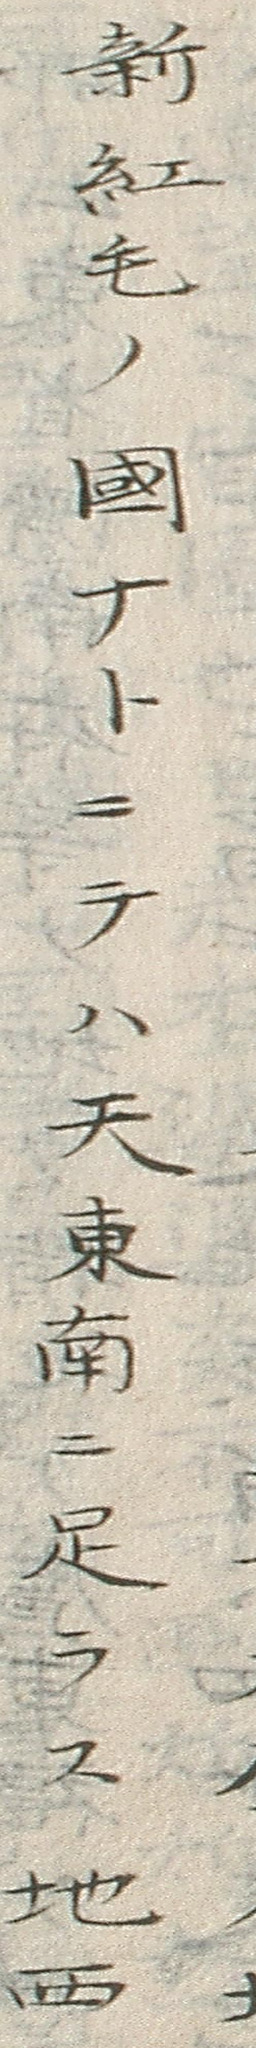新紅毛ノ国ナトニテハ天東南ニ足ラス地西
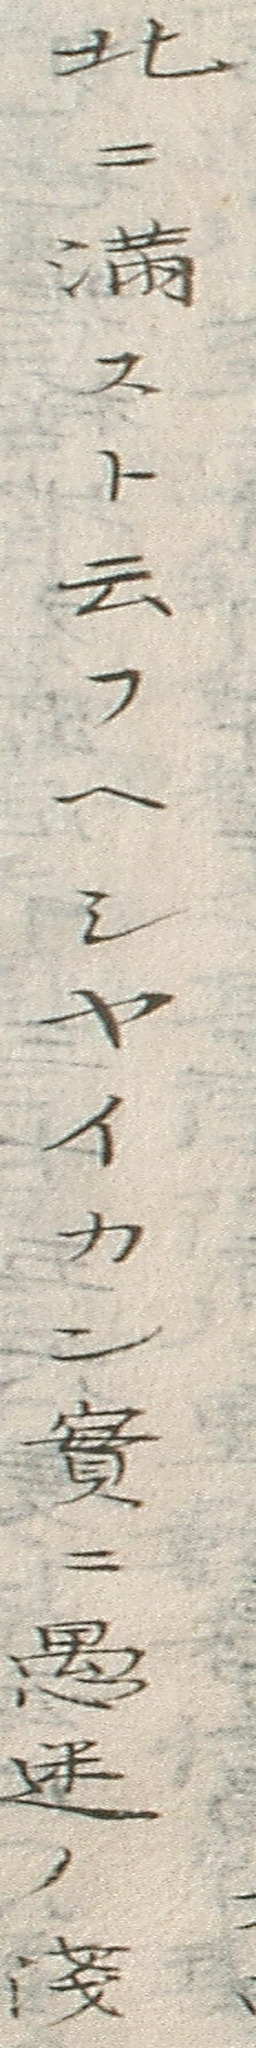北ニ満スト云フヘシヤイカン実ニ愚迷ノ浅

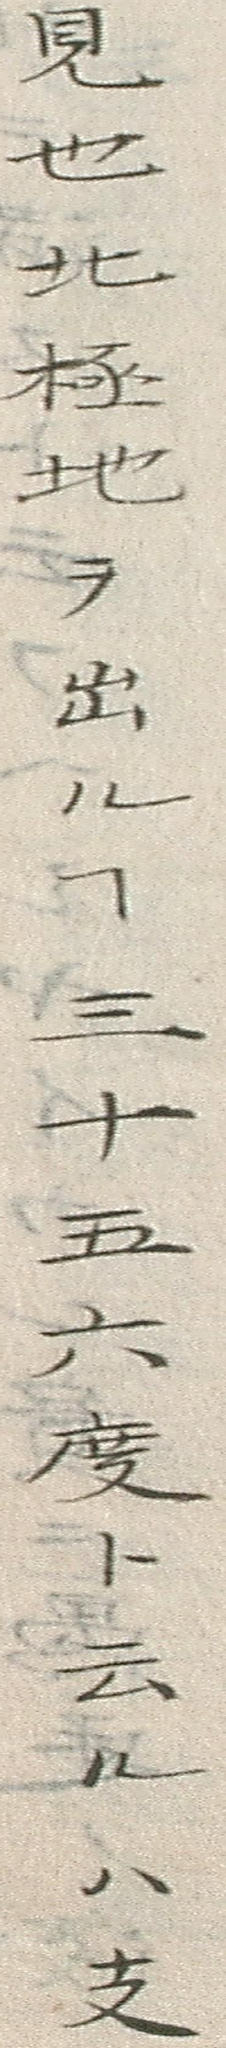見也北極地ヲ出ルコト三十五六度ト云ルハ支
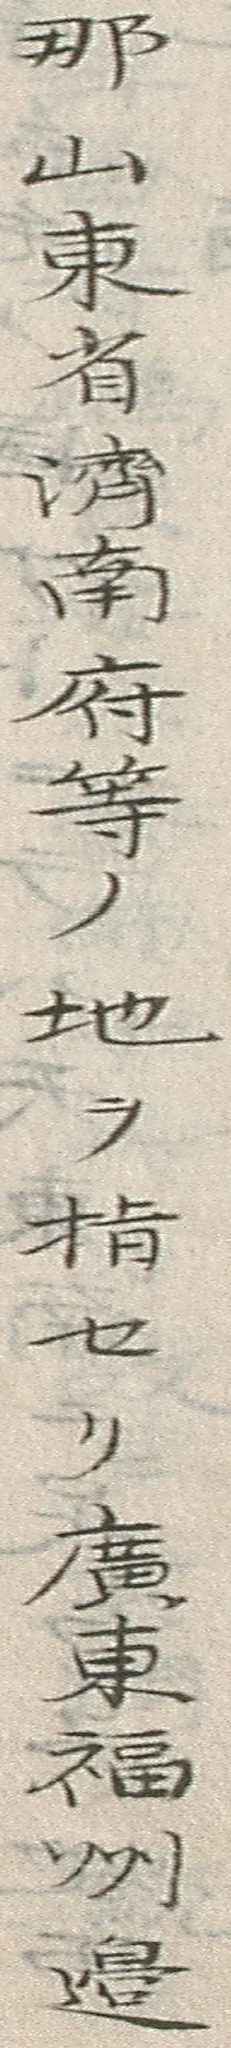那山東省濟南府等ノ地ヲ指セリ広東福州辺
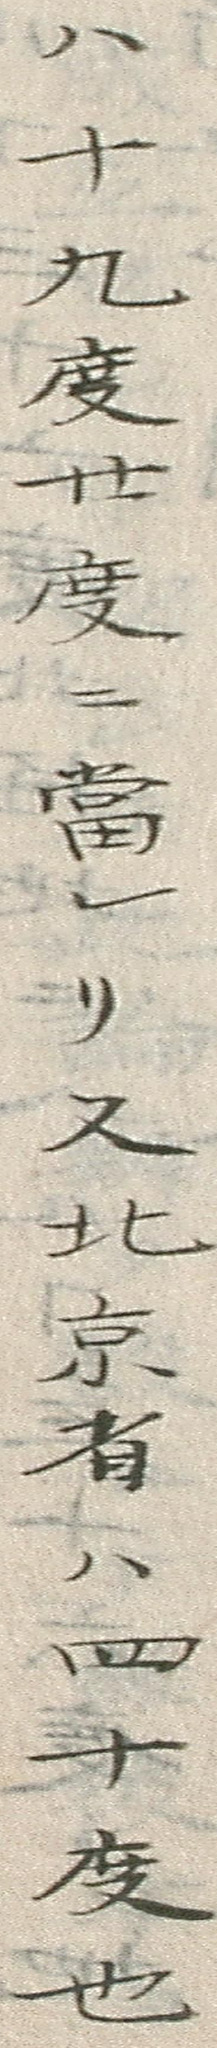ハ十九度廿度ニ当レリ又北京省ハ四十九度也
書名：天學略名目羽翼　全
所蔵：東京大学地震研究所図書室 Earthquake Research Institute Library, The University of Tokyo, JAPAN
